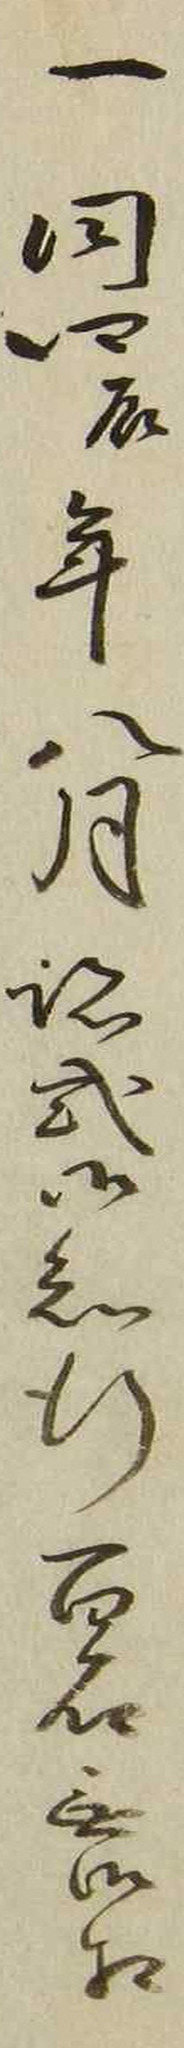一同四辰年八月跡式御知行百石無御相
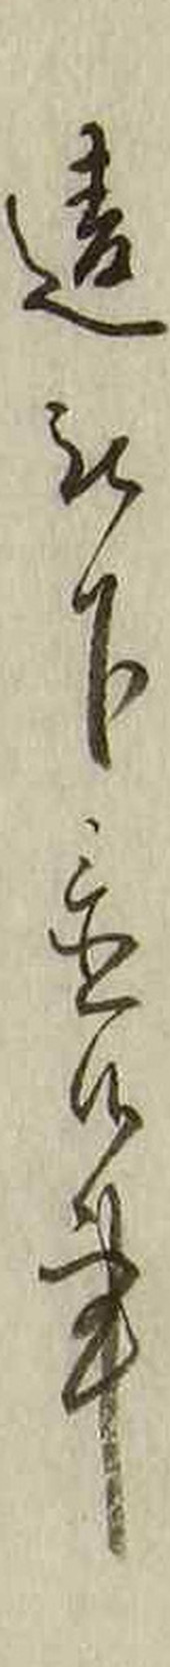違被下置候事
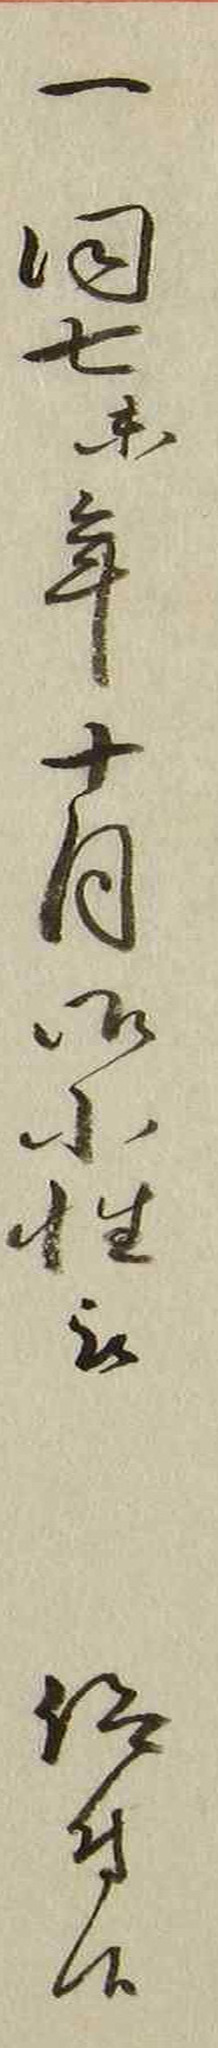一同七未年十月御小性被仰付候
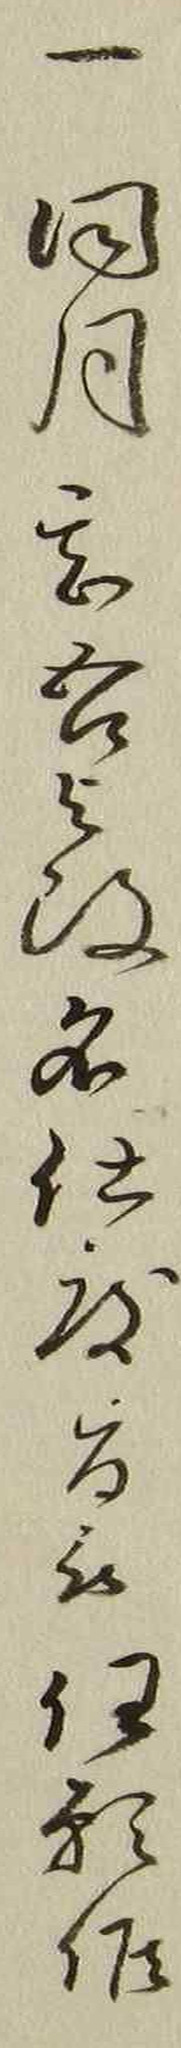一同月甚吾与改名仕度旨被任願候
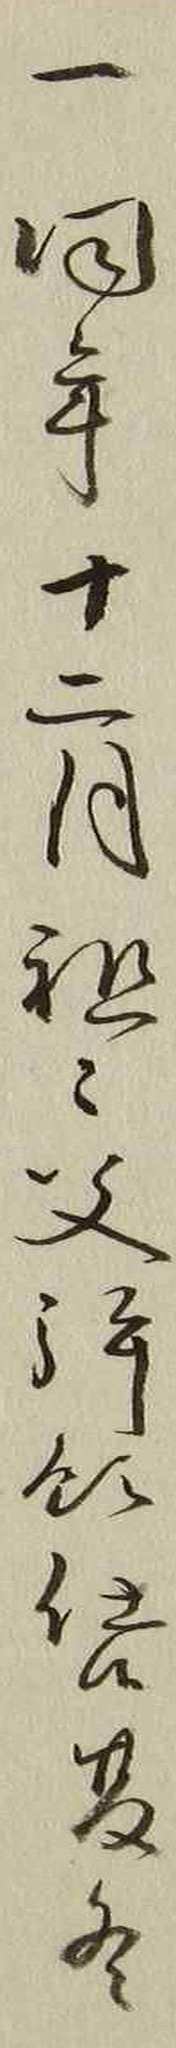一同年十二月祖々父拝領仕候夏冬
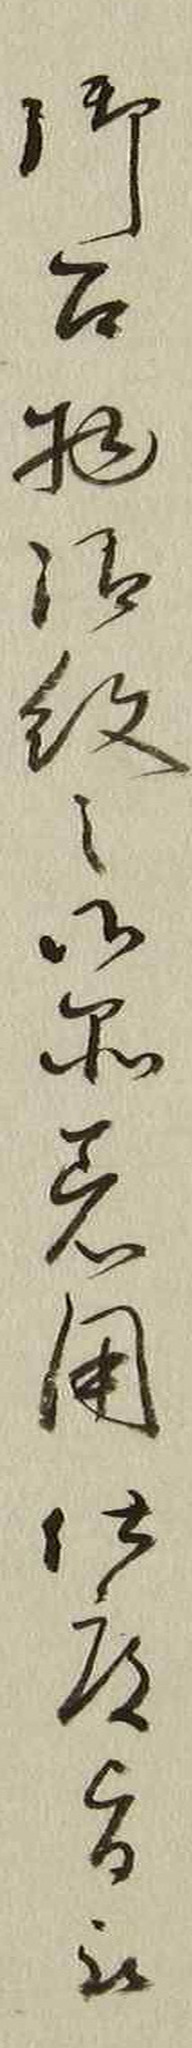御召物御紋之御品着用仕度旨被
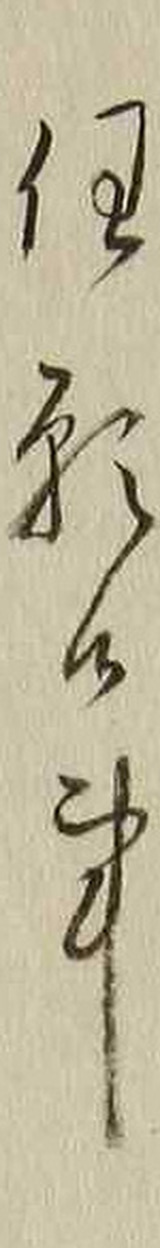任願候事
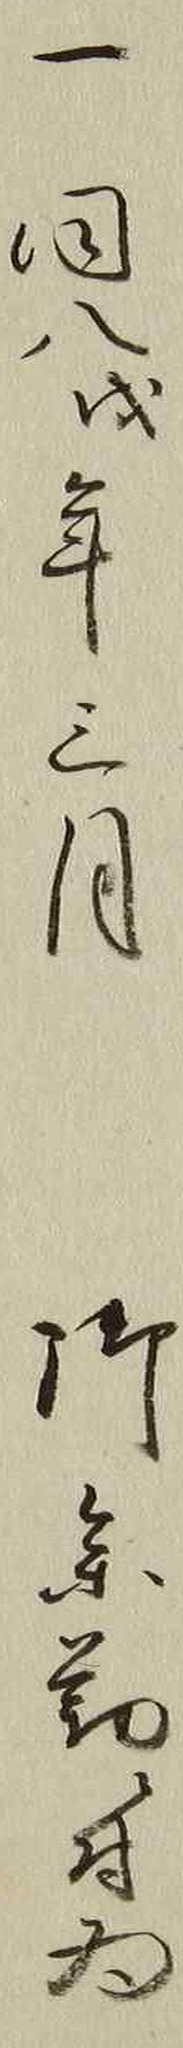一同八戌年三月御参勤ニ付為
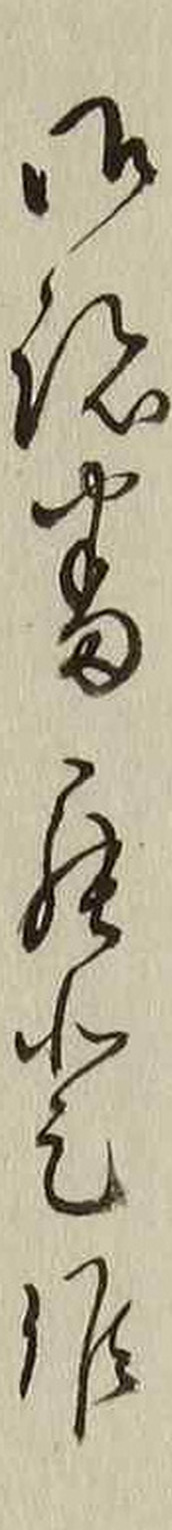御跡番罷登候
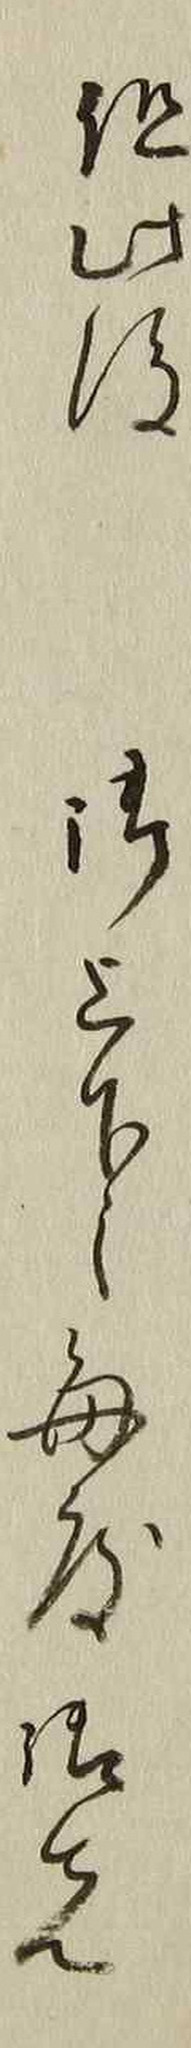但此後御上下之毎度御先
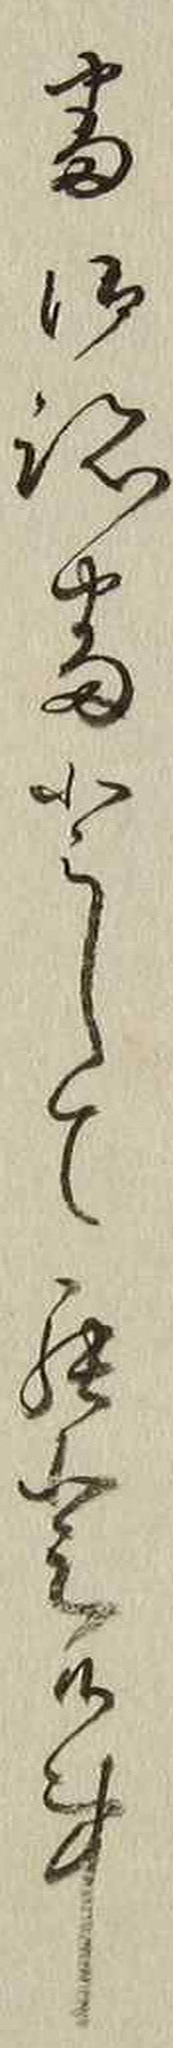番御跡番として罷登候事
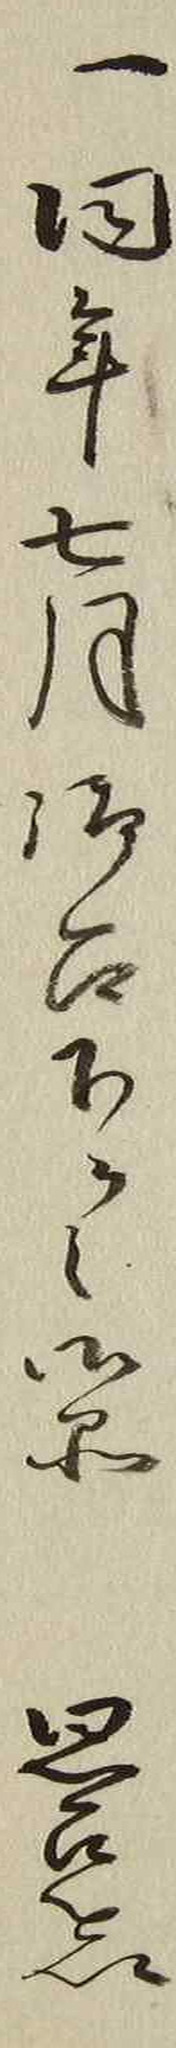一同年七月御召下ケ之御品思召を以
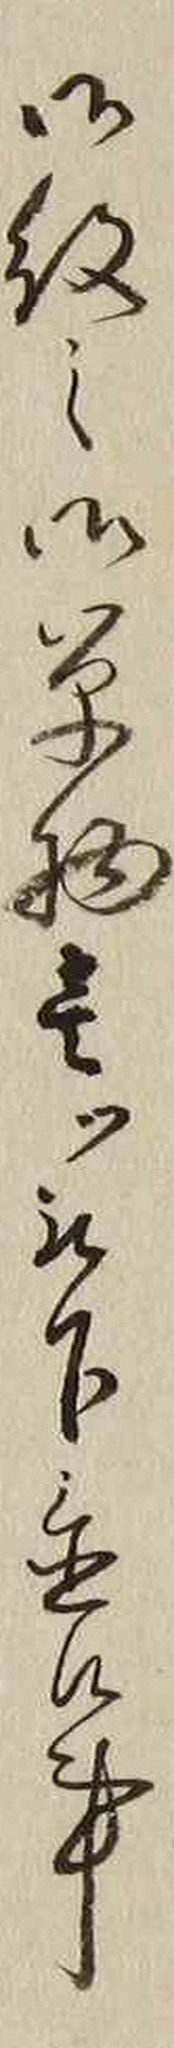御紋之御単物壱ツ被下置候事
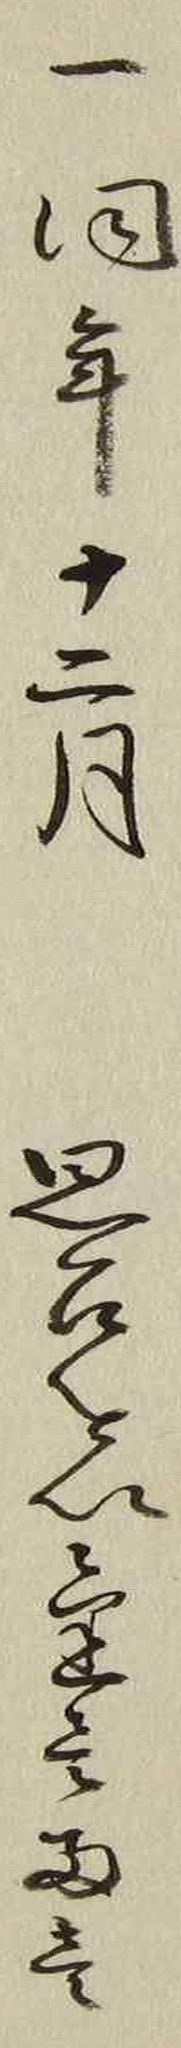一同年十二月思召を以金壱両壱
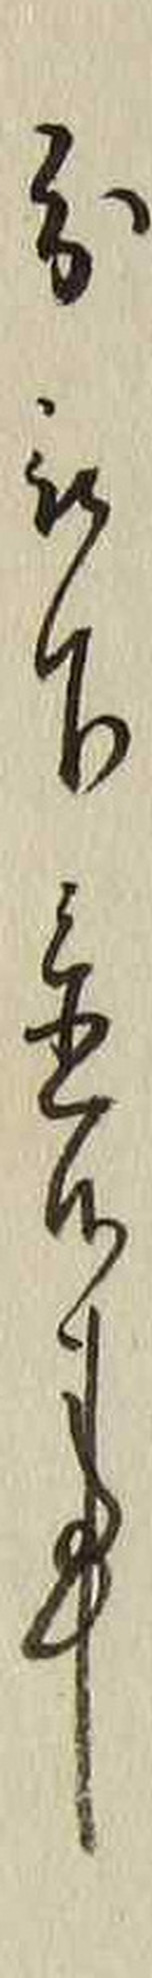分被下置候事
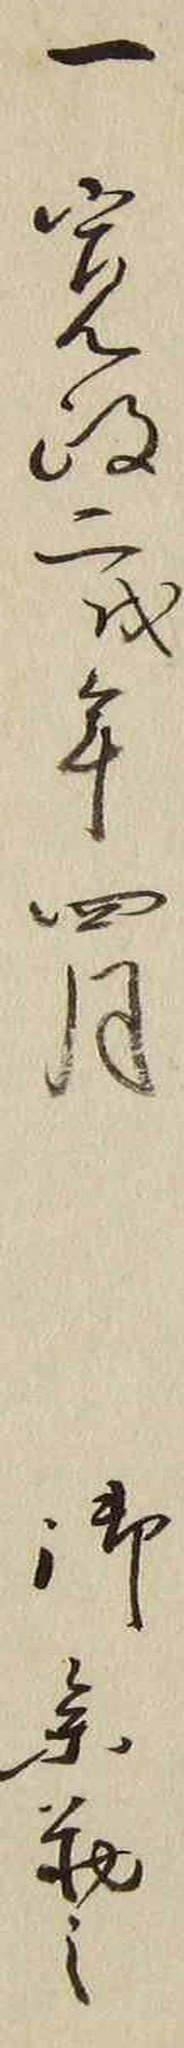一寛政二戌年四月御参勤之
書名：諸士系譜　巻之4　い之部4
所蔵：会津若松市立会津図書館
